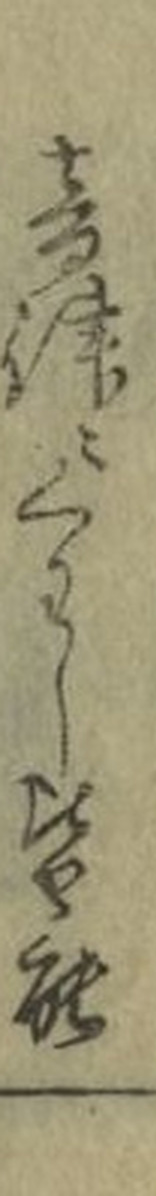音律にくわし皆能
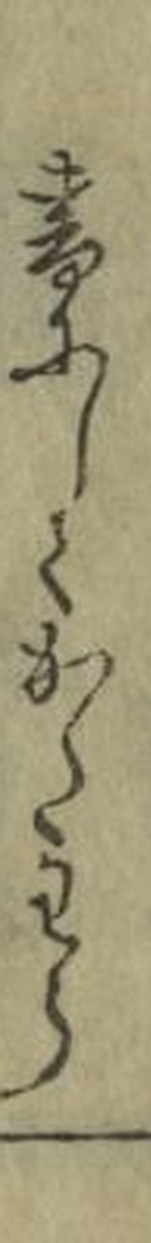書にしてかたわら
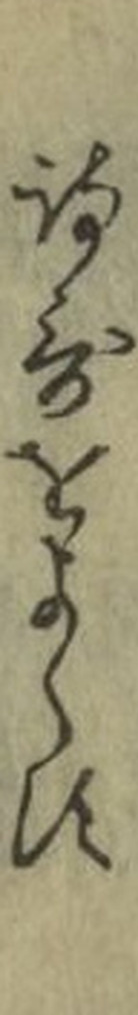詩哥をよくす
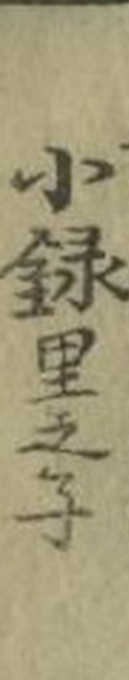小録里之子
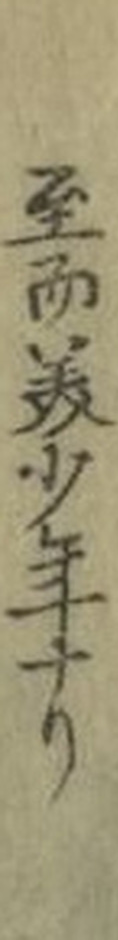至而美少年なり

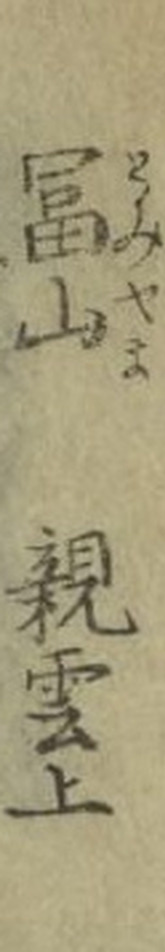富山親雲上
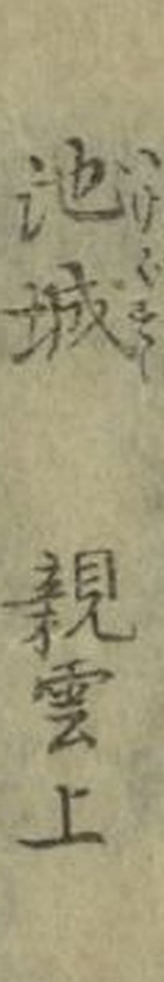池城親雲上
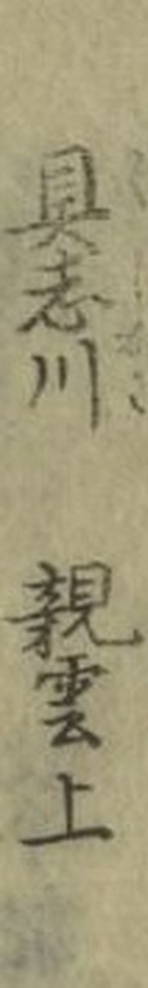具志川親雲上
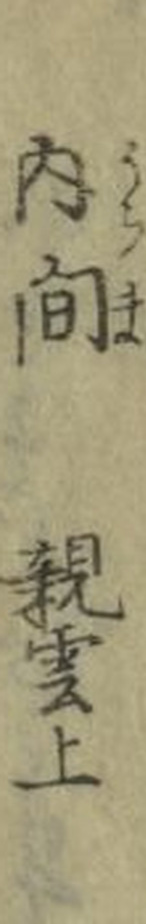内間親雲上
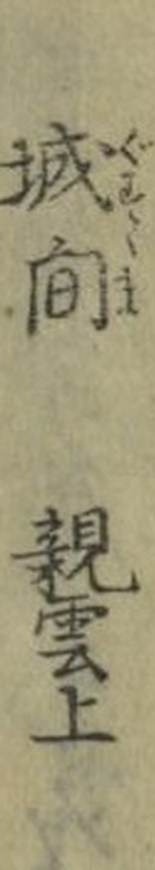城間親雲上
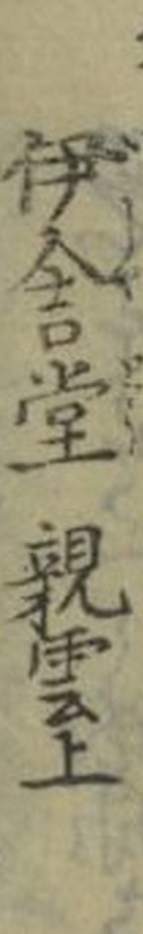伊舎堂親雲上
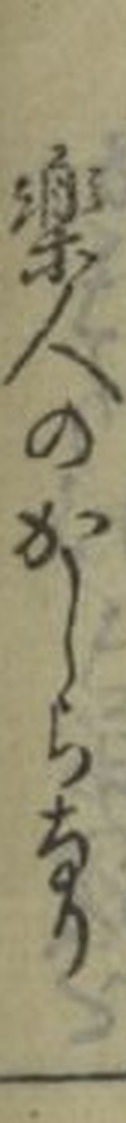楽人のかしらなり
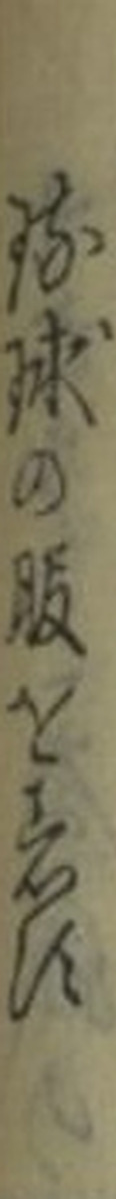琉球の服を着す
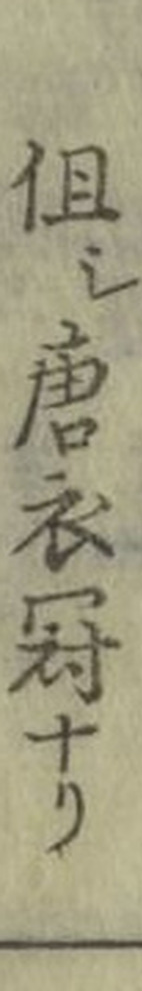但シ唐衣冠ナリ
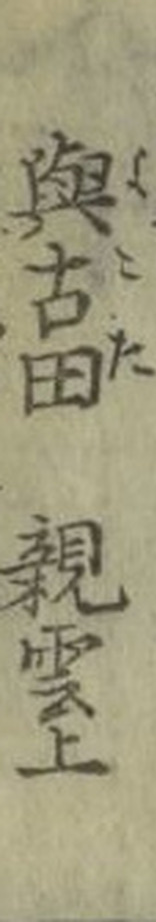與古田親雲上
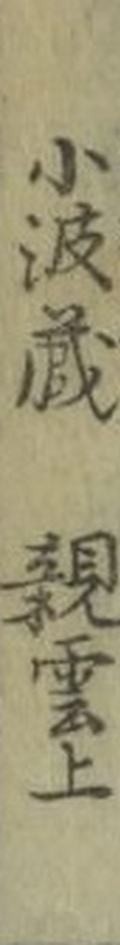小波蔵親雲上
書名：琉球人行列記
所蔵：University of the Ryukyus Library
